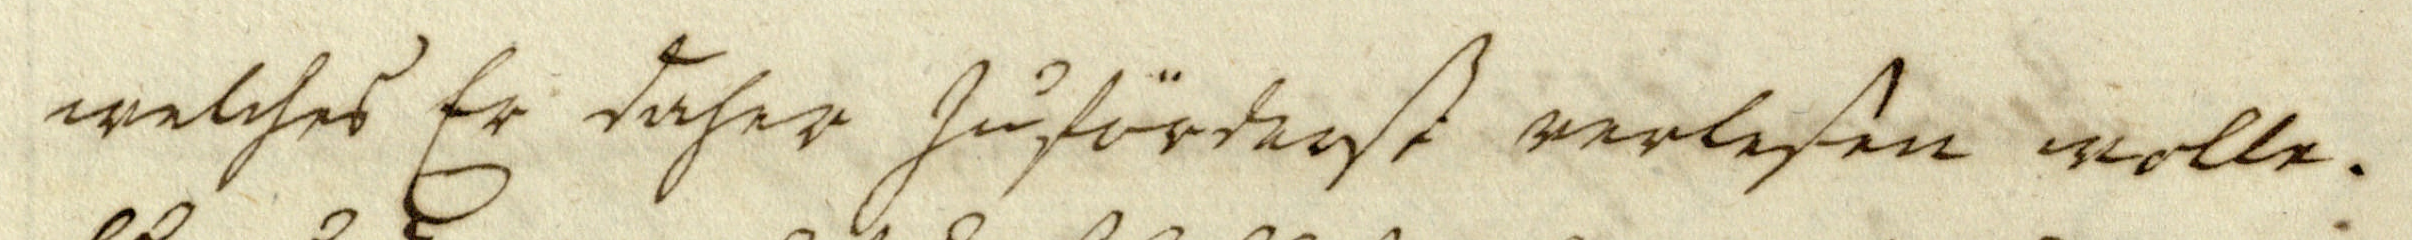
welches Er daher zuförderst verlesen wolle.
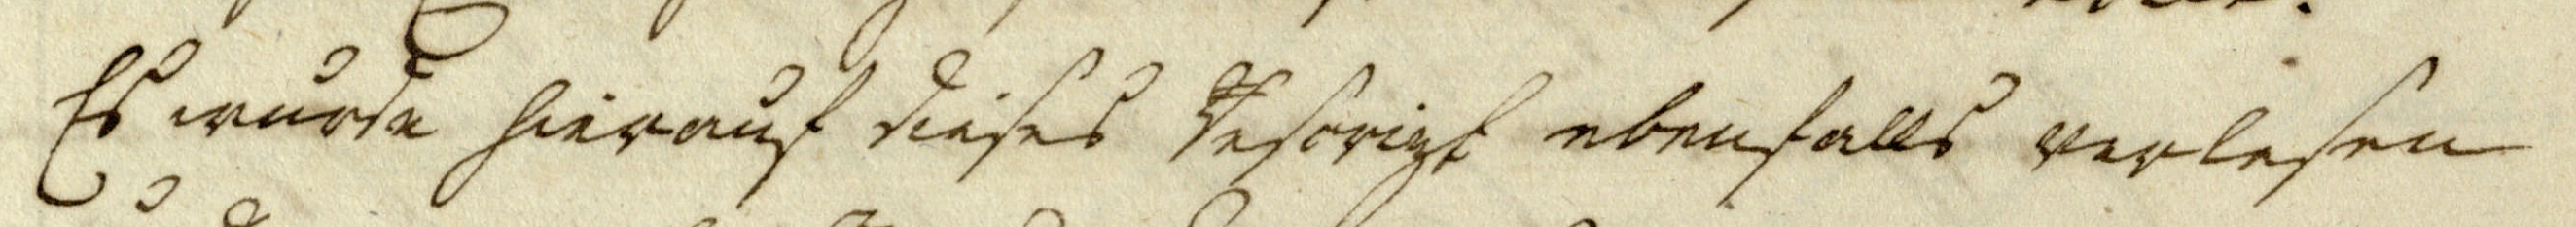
Es wurde hierauf dieses Rescript ebenfalls verlesen
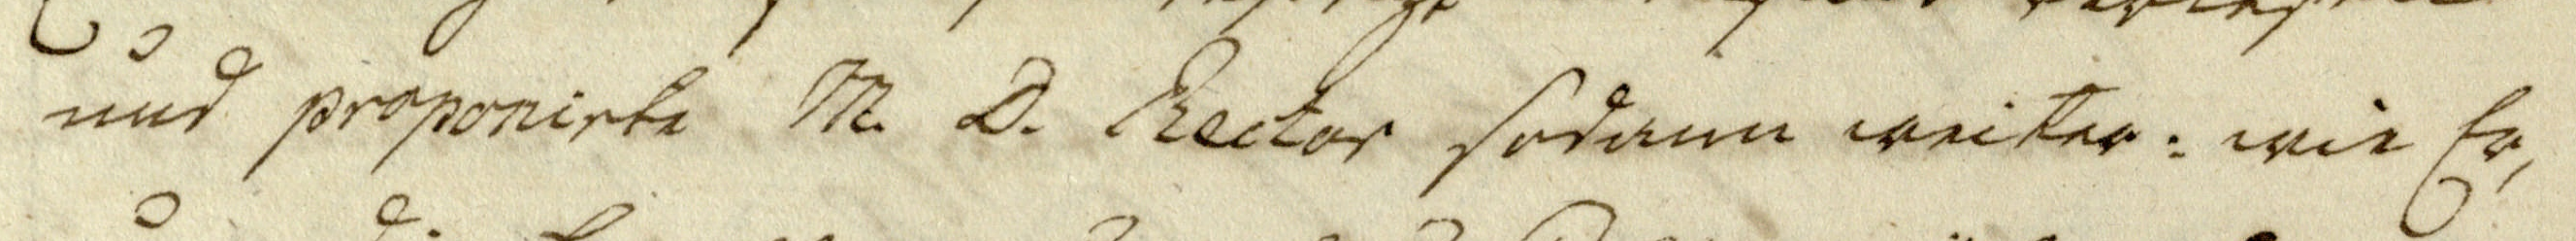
und proponirte M. D. Rector sodann weiter: wie Er,
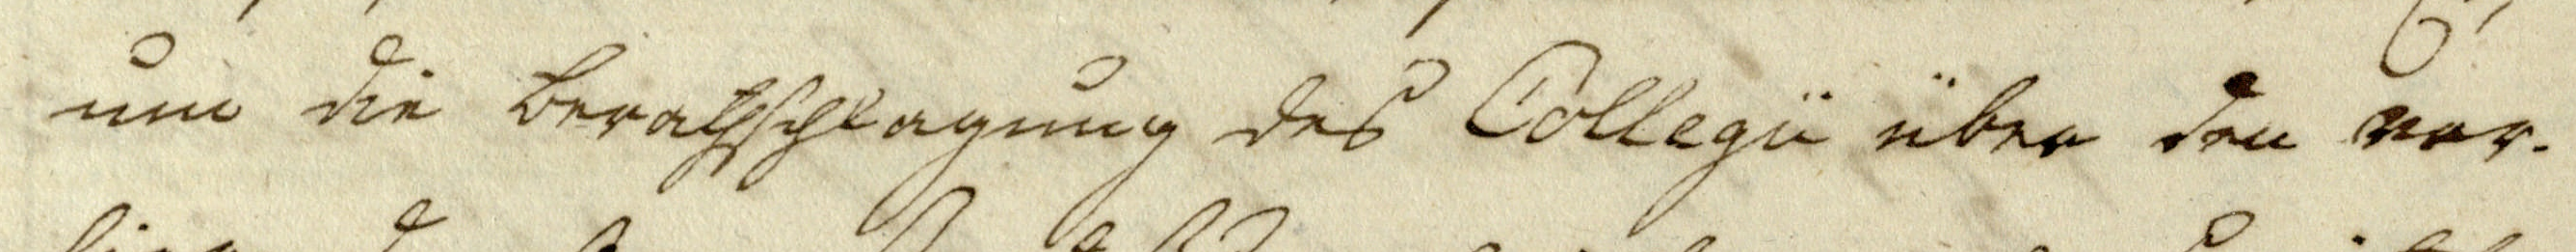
um die Berathschlagung des Collegii über den vor¬
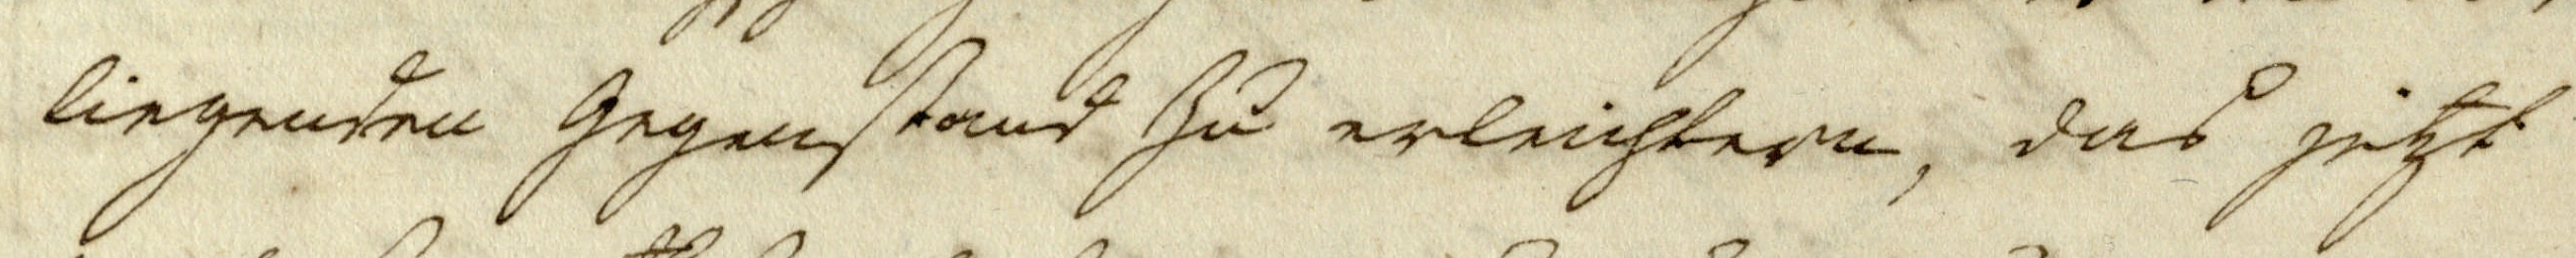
liegenden Gegenstand zu erleichtern, das jetzt
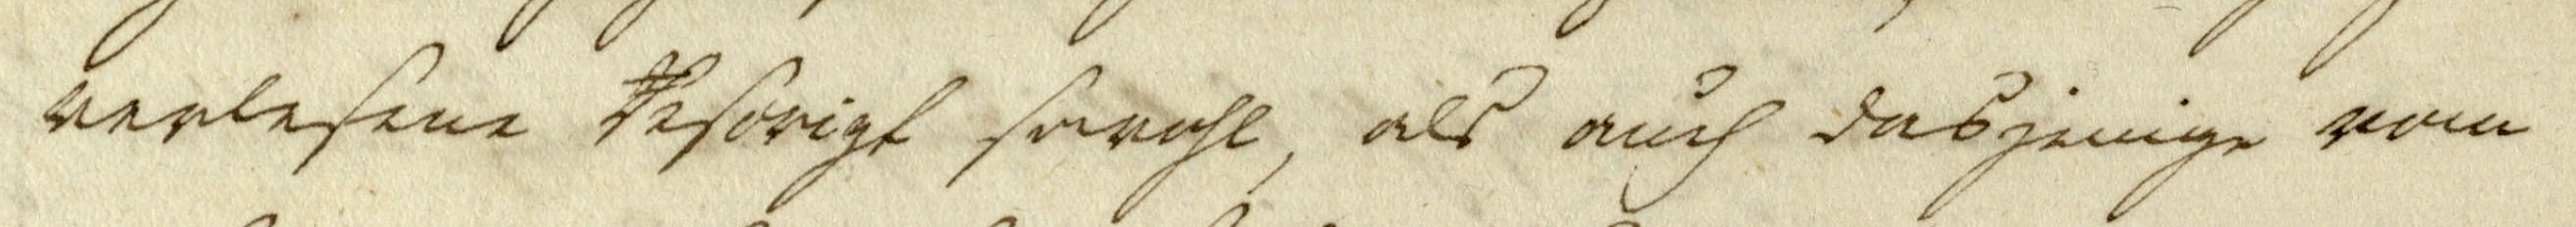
verlesene Rescript sowohl, als auch dasjenige vom
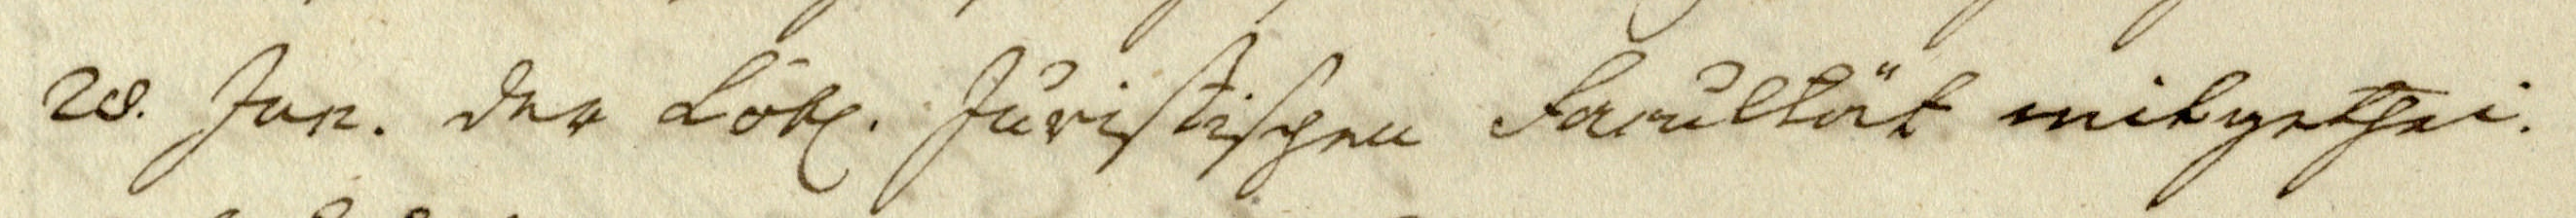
28. Jun. der Löbl. Juristischen Facultät mitgethei¬
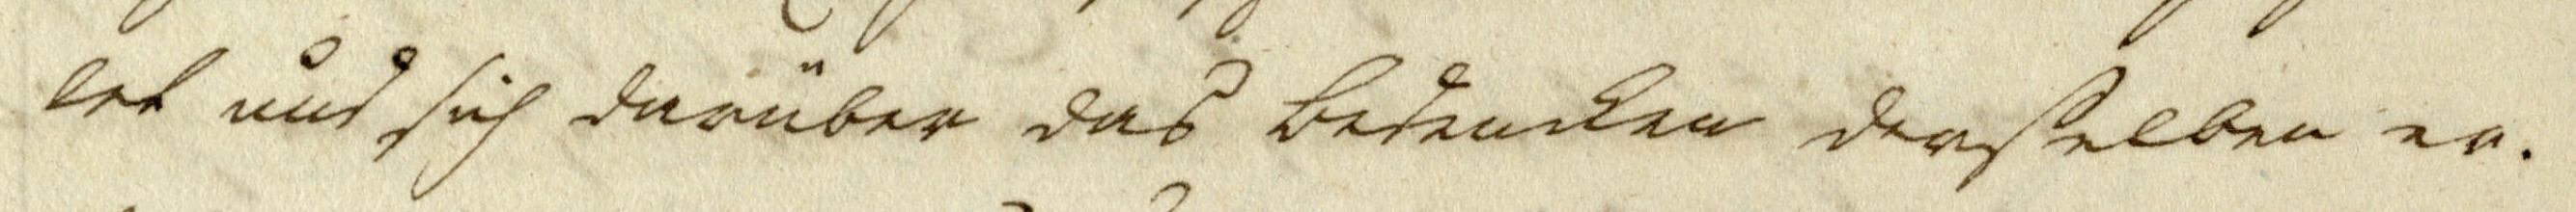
let und sich darüber das Bedencken derselben er¬
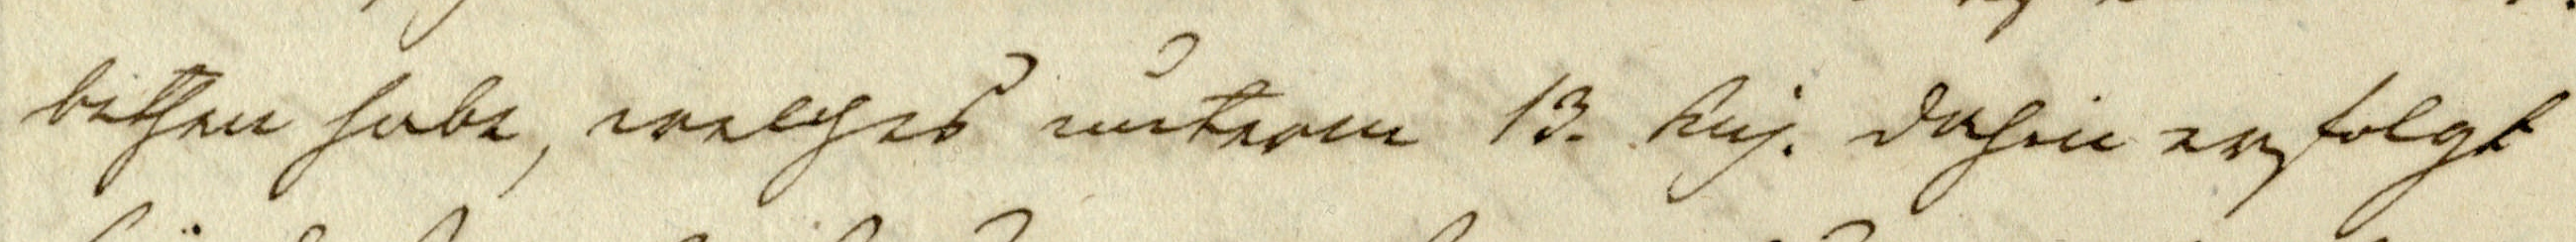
bethen habe, welches unterm 13. huj. dahin erfolgt
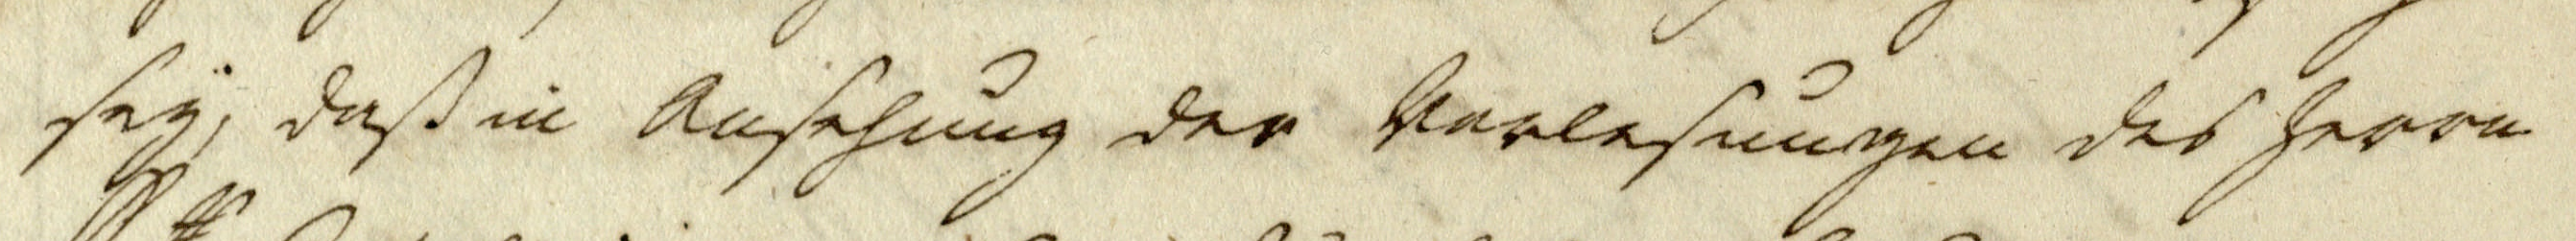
seÿ, daß in Ansehung der Vorlesungen des Herrn
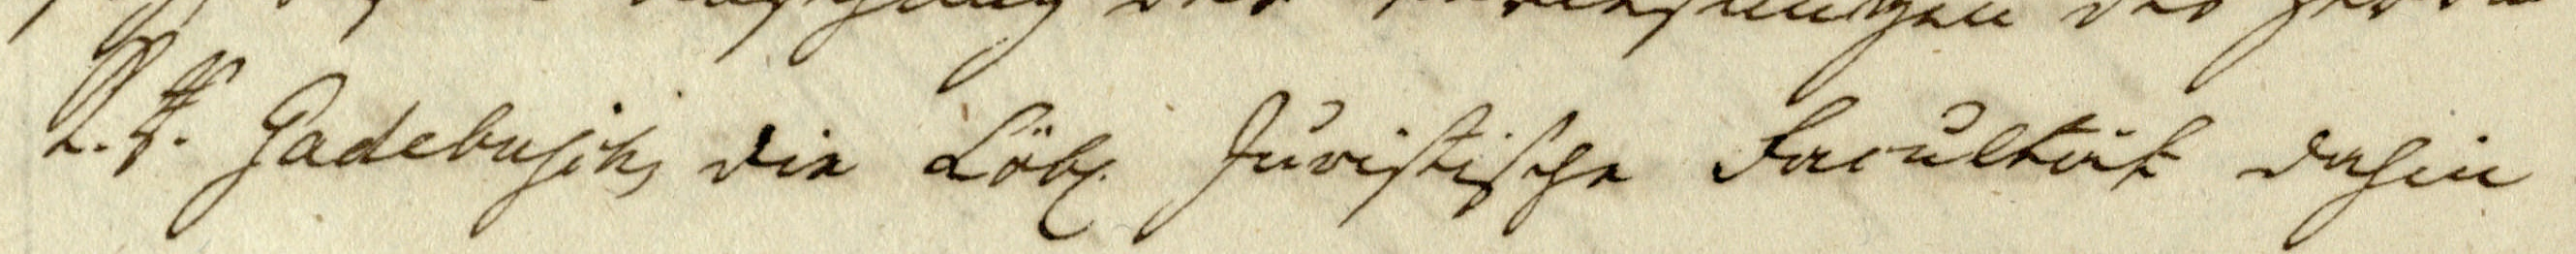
K. R. Gadebusch, die Löbl. Juristische Facultät dahin
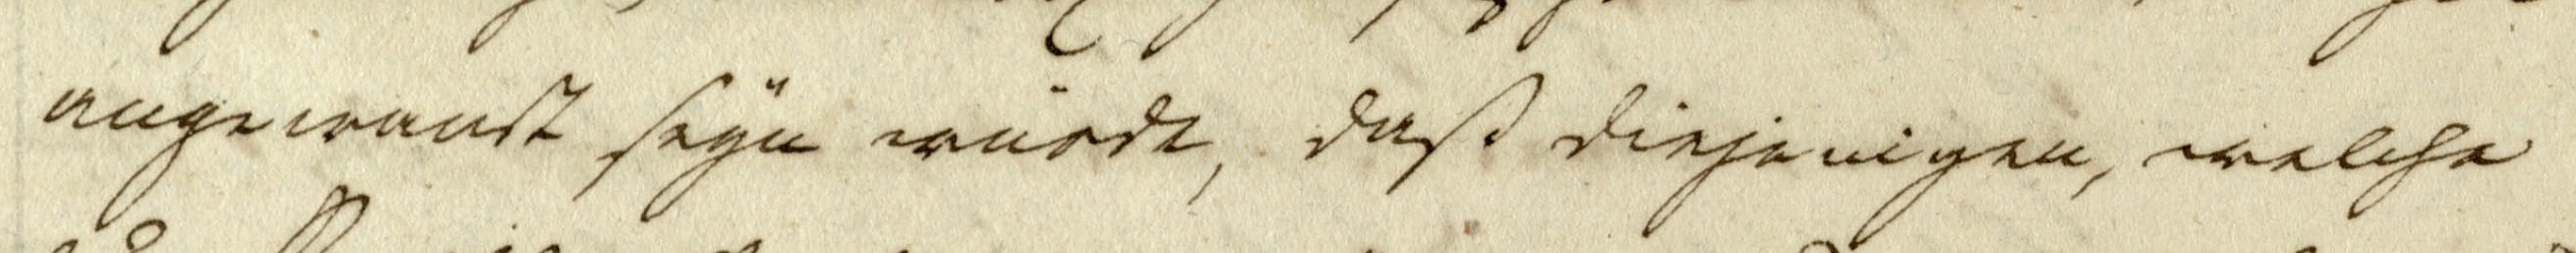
angewandt seÿn würde, daß diejenigen, welche
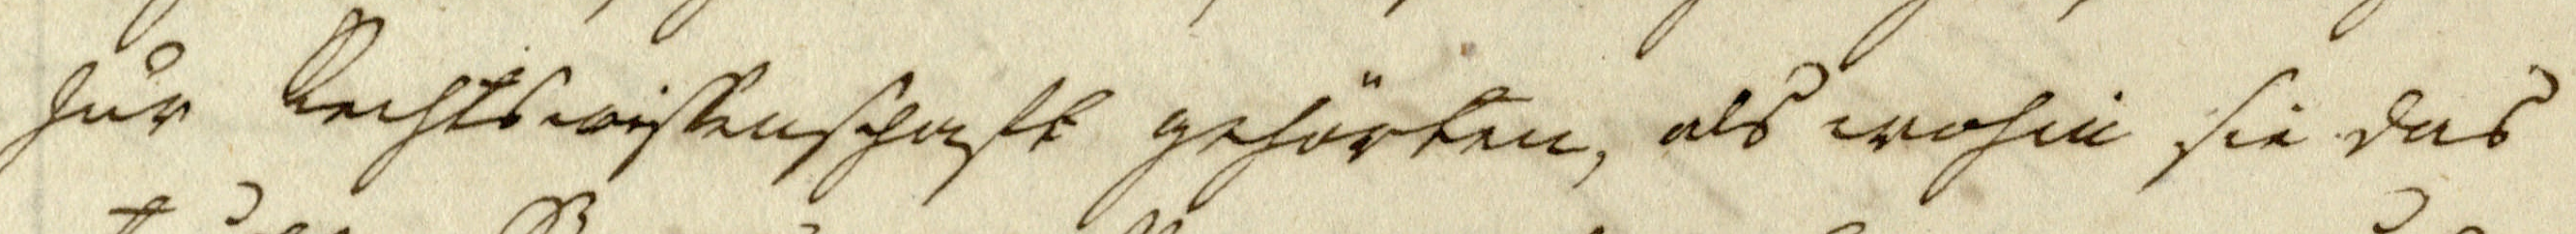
zur Rechtswissenschaft gehörten, als wohin sie das
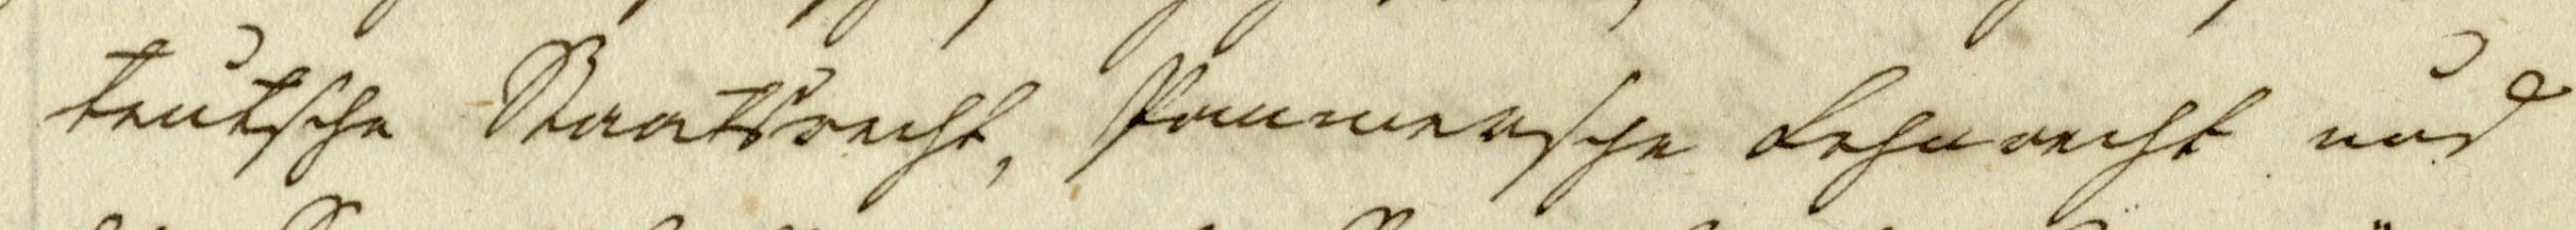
teutsche Staatsrecht, Pommersche Lehnrecht und
